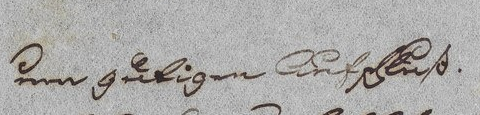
um gütigen Aufschluß.
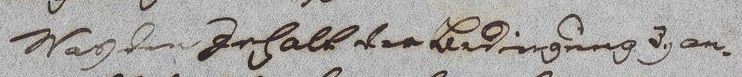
Was den Inhalt der Bedingung 3.) an-
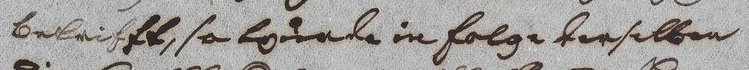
betrifft, so würde in Folge derselben
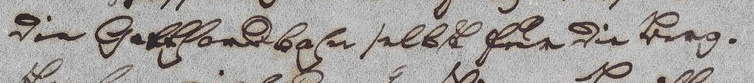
die Gotthardbahn selbst für die Berg-
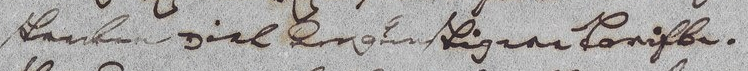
strecken viel ungünstigere Tarifbe-
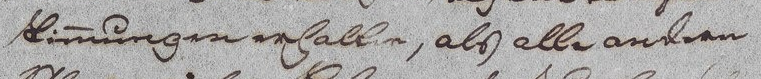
stimmungen erhalten, als alle andern
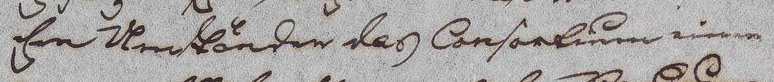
chen Umständen das Consortium einen
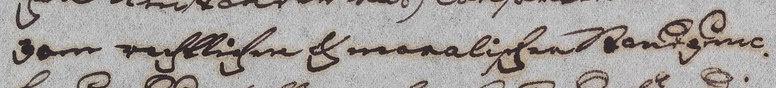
vom rechtlichen & moralischen Standpunc-
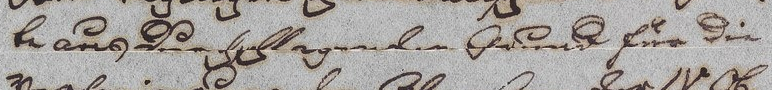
te aus durchschlagenden Grund für die
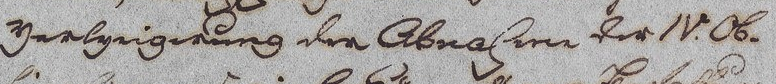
Verweigerung der Abnahme der IV. Ob-
